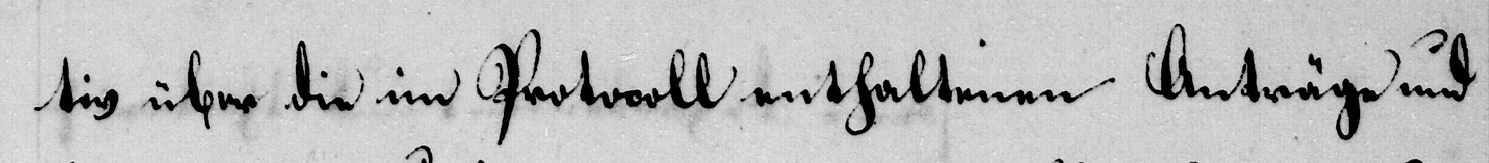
tiv über die im Protocoll enthaltenen Anträge und
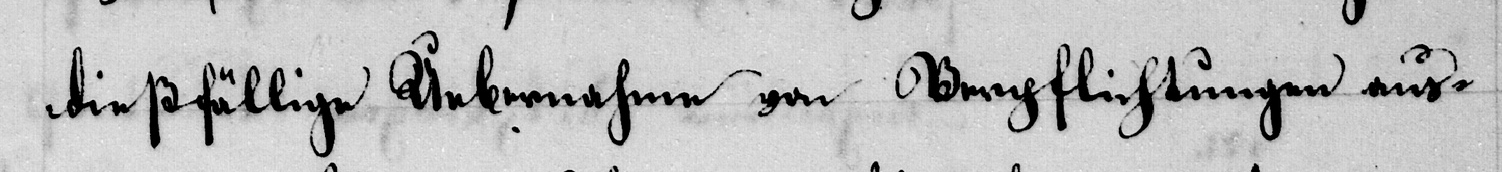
dießfällige Uebernahme von Verpflichtungen aus¬
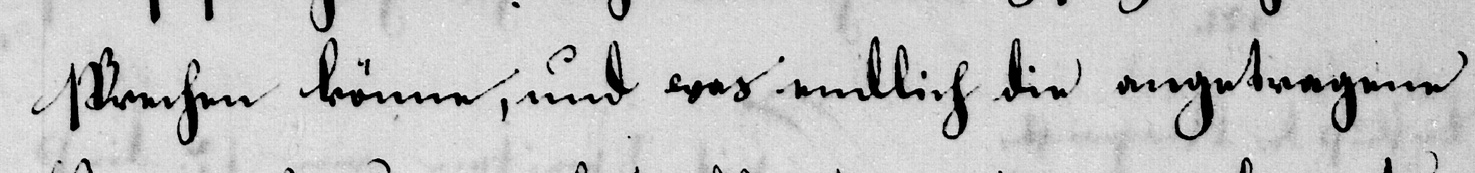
sprechen könne, und was endlich die angetragene
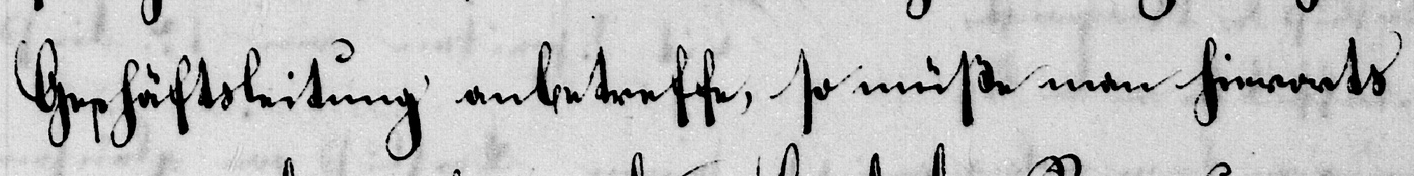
Geschäftsleitung anbetreffe, so müße man hierorts
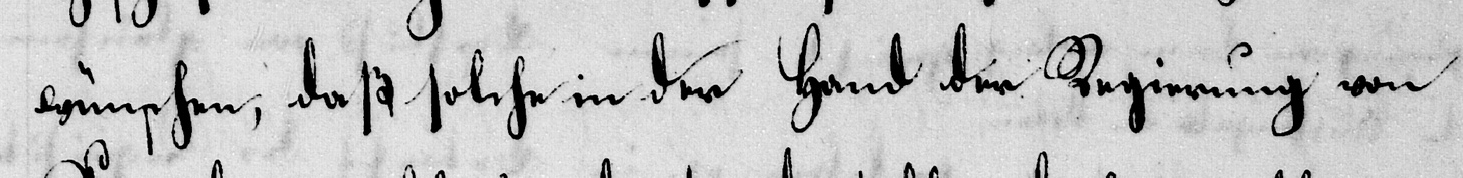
wünschen, daß solche in der Hand der Regierung von
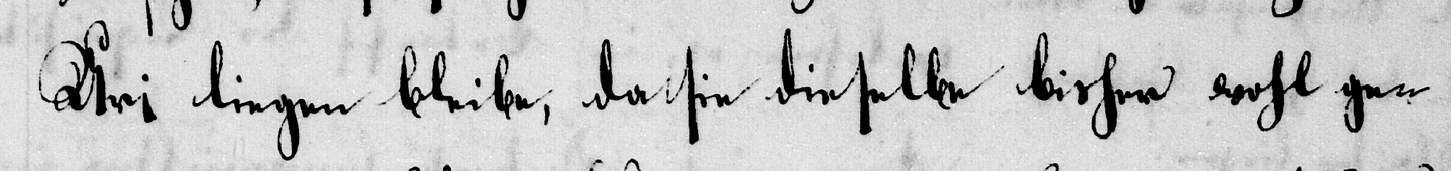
Uri liegen bleibe, da sie dieselbe bisher wohl ge¬
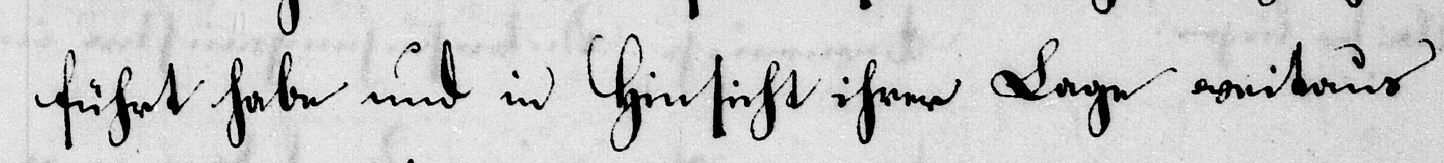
führt habe und in Hinsicht ihrer Lage weitaus
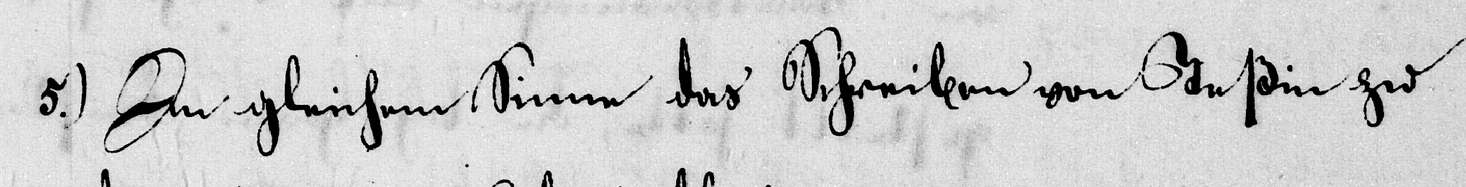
5.) In gleichem Sinne das Schreiben von Teßin zu
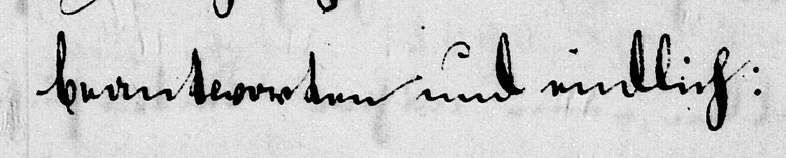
beantworten und endlich:
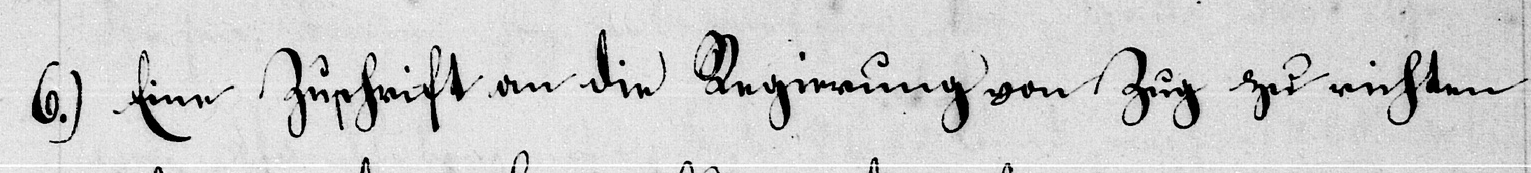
6.) Eine Zuschrift an die Regierung von Zug zu richten
